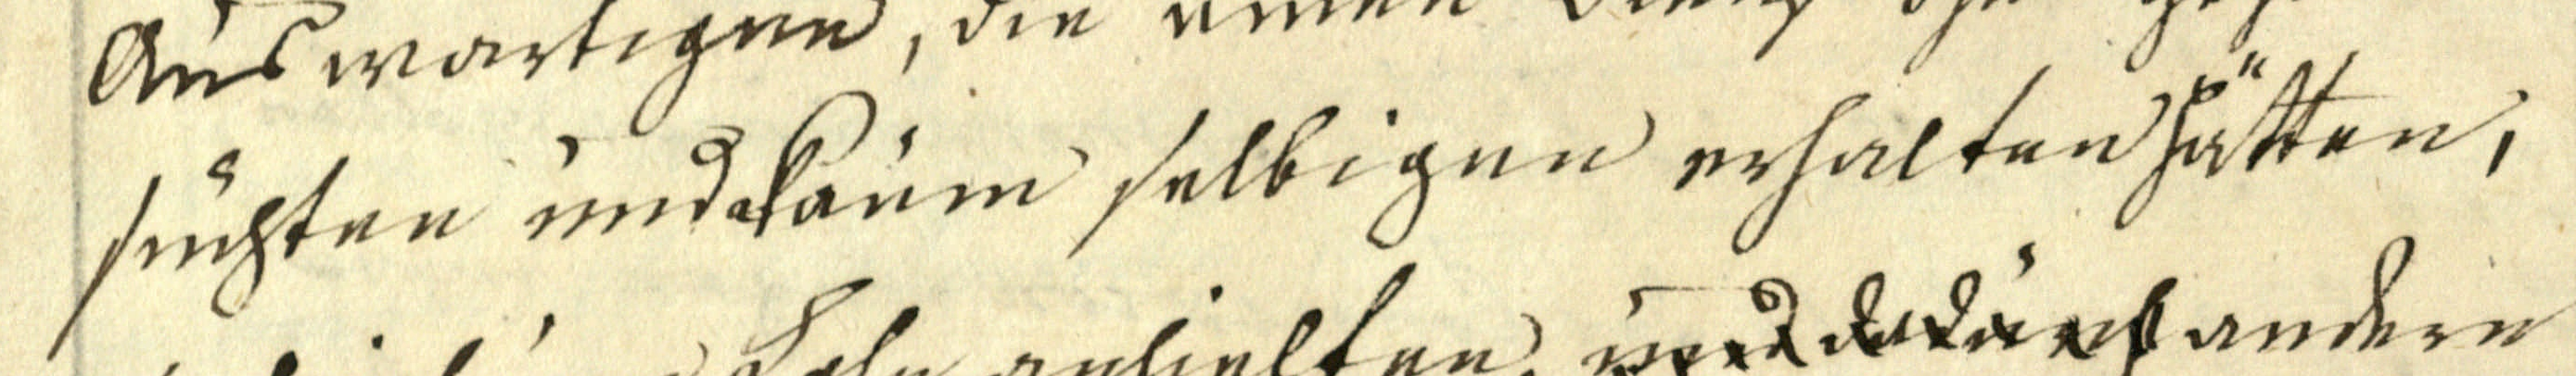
suchten und kaum selbigen erhalten hätten,
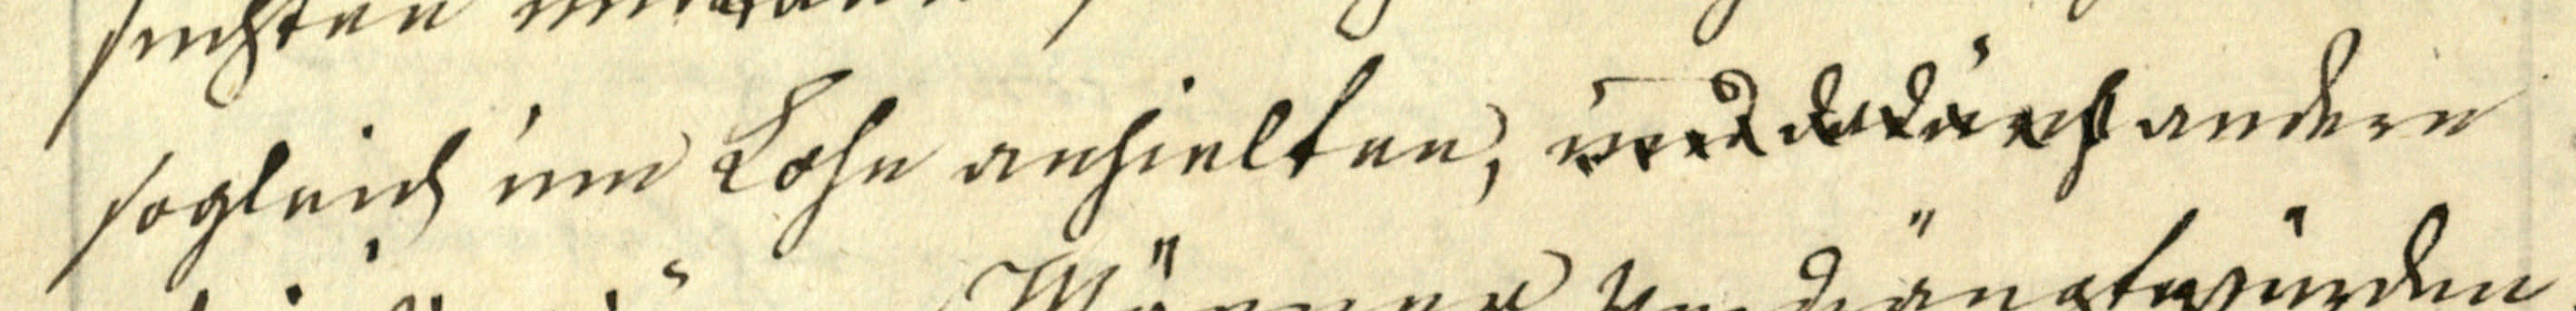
sogleich um Lohn anhielten; und dadurch andere
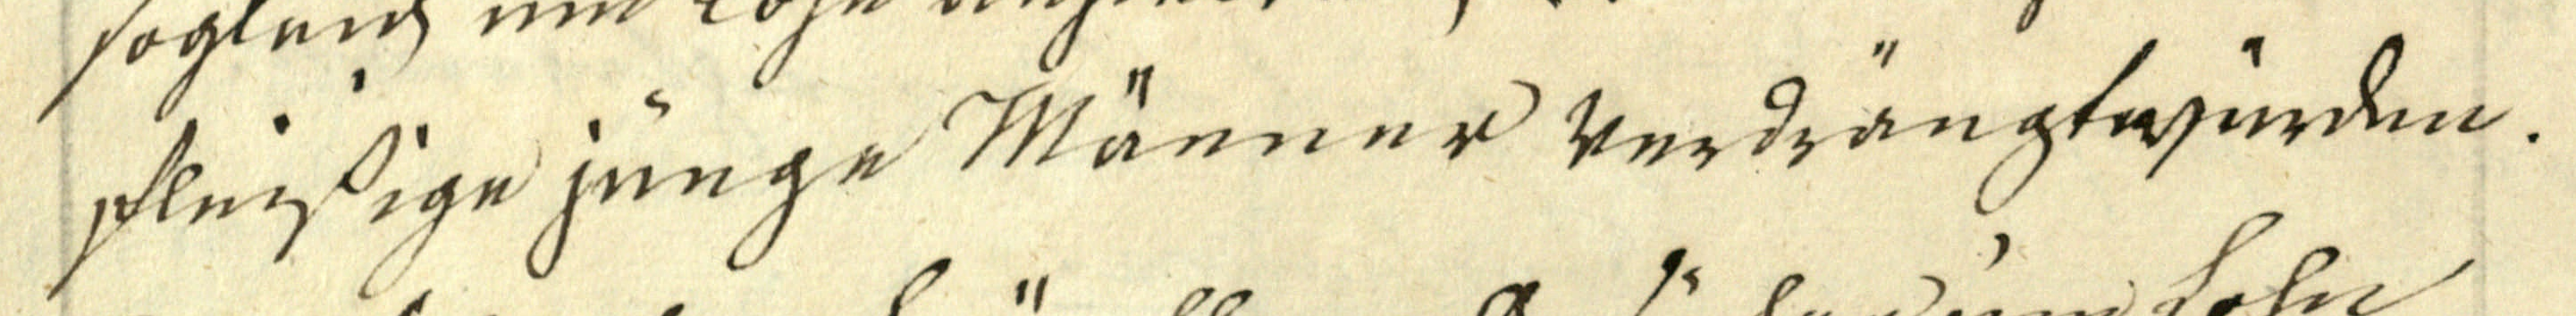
fleißige junge Männer verdrängt würden.
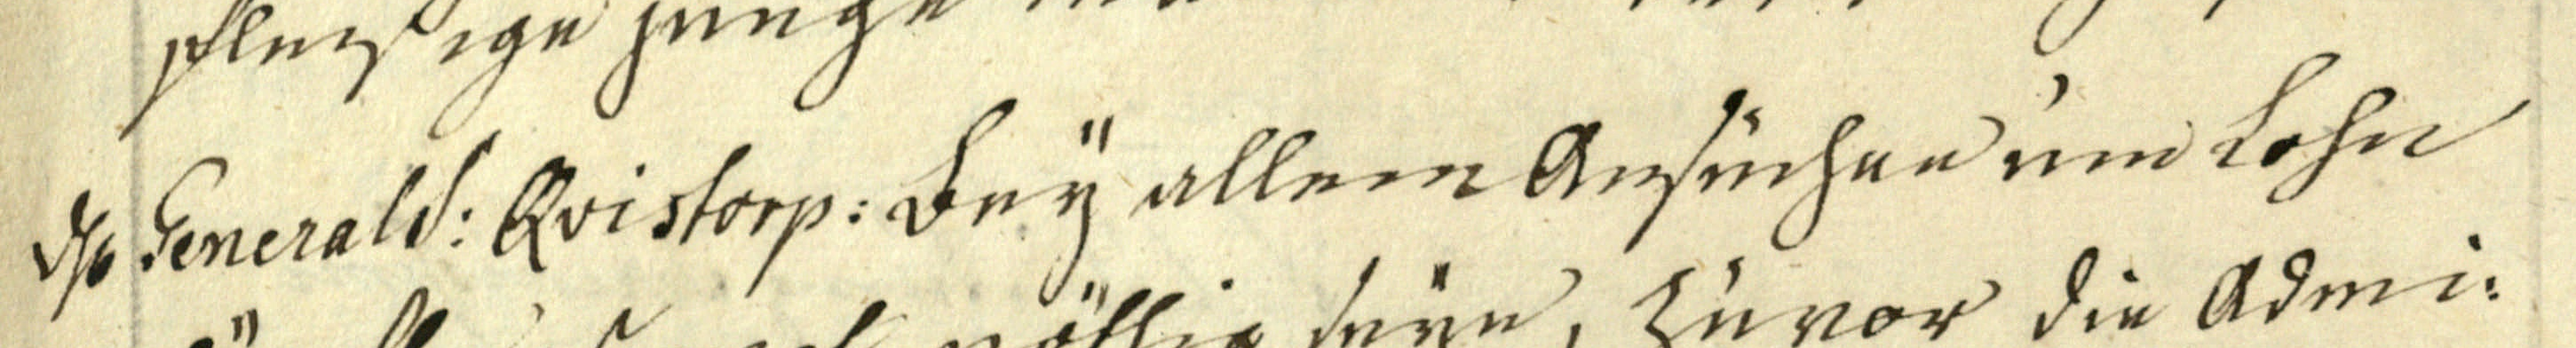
dh GeneralS. Quistorp. Beÿ allem Ansuchen um Lohn
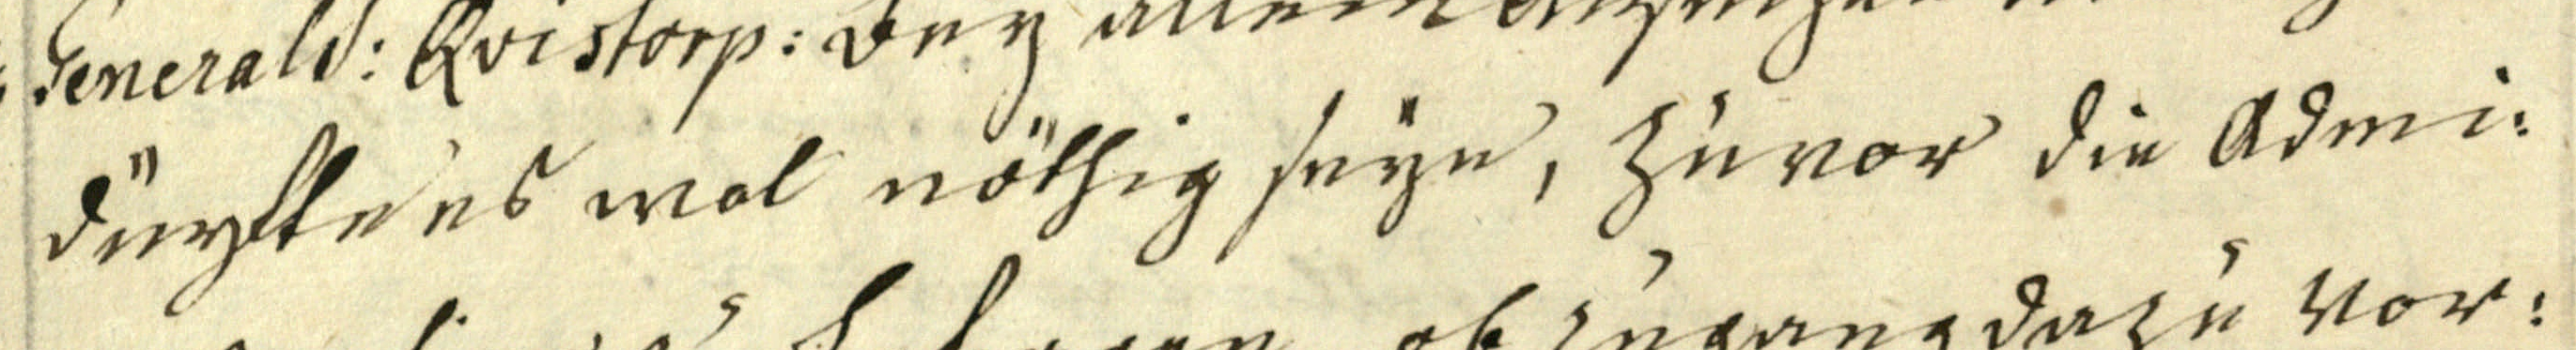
dürfte es wol nöthig seÿn, zuvor die Admi¬
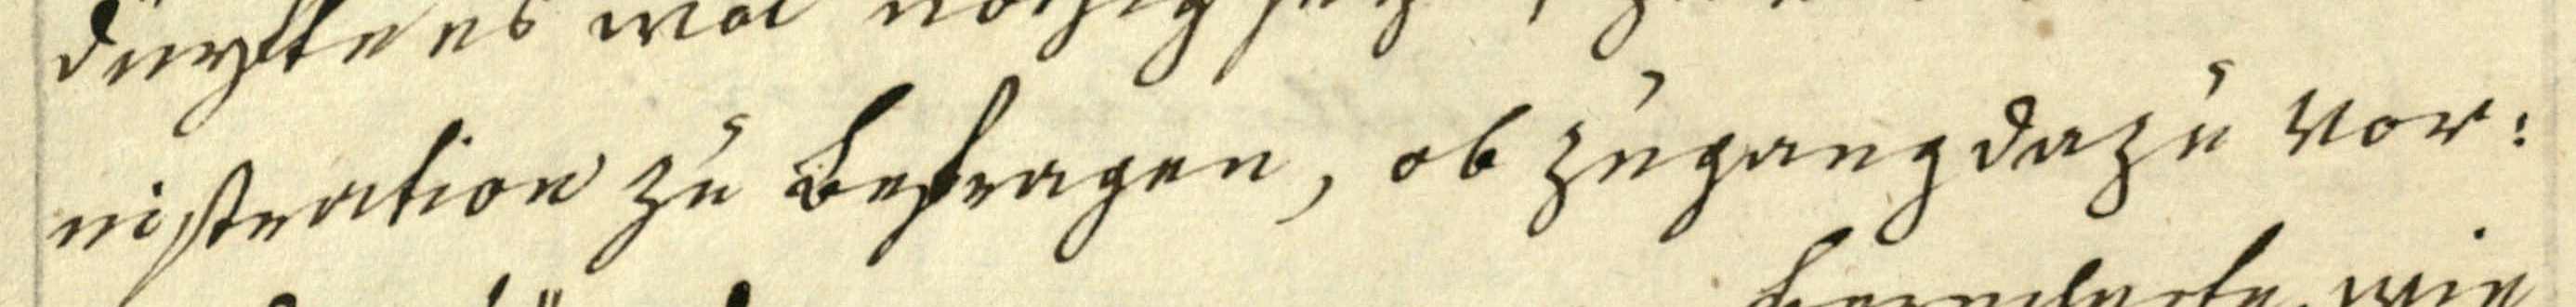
nistration zu befragen, ob Zugang dazu vor¬
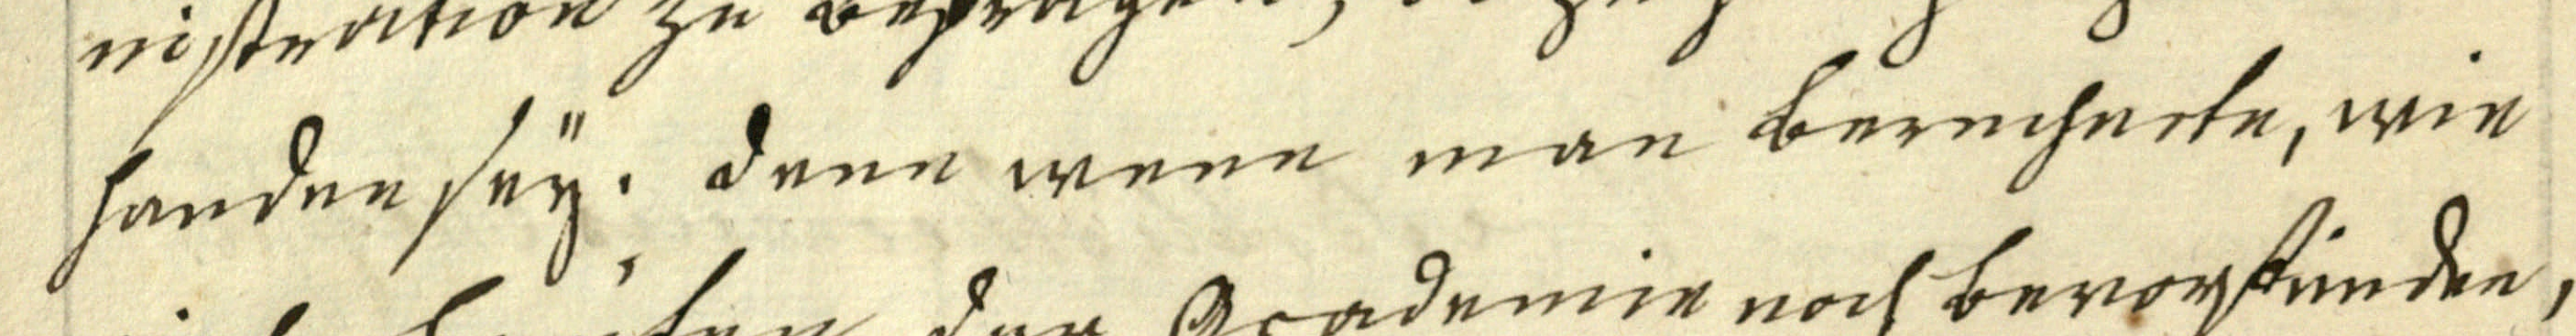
handen seÿ. denn wenn man berechnete, wie
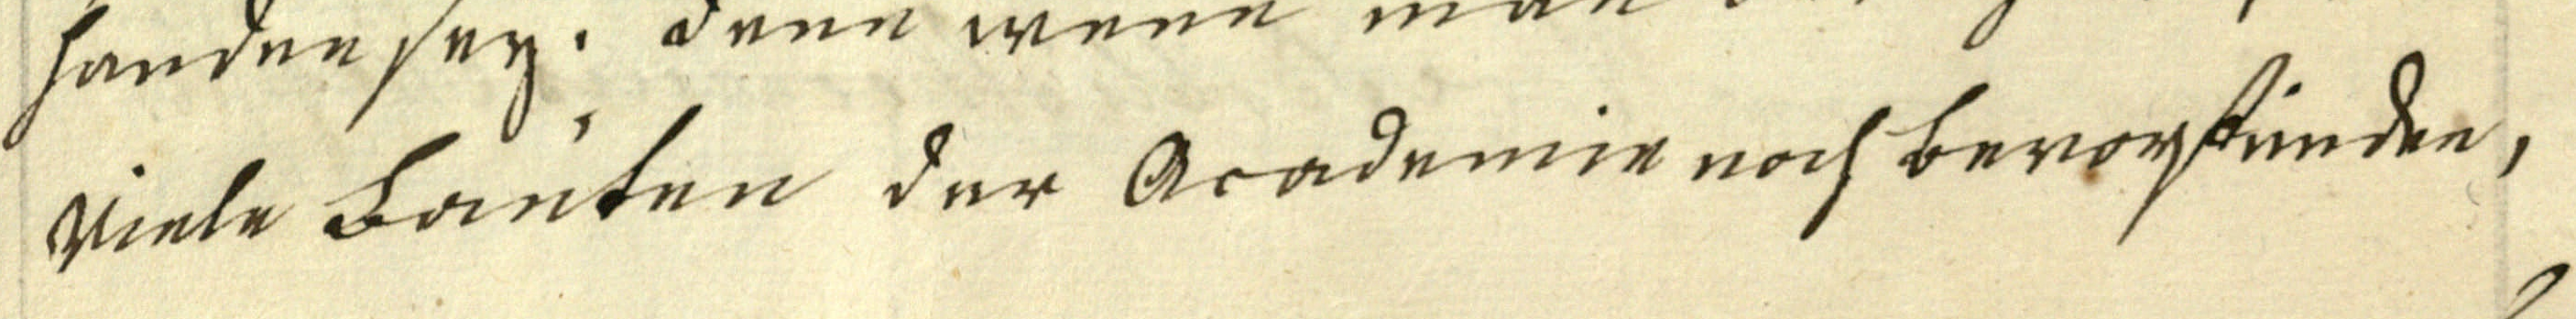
viele Bauten der Academie noch bevorstünden,
